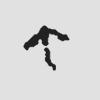虫
